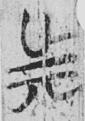者
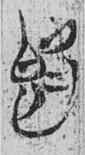既
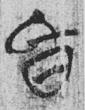昏（聞）
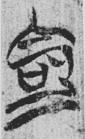命
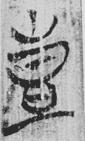壴（矣）
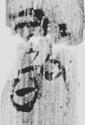敢
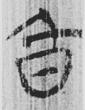昏（問）
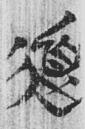道
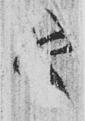民
